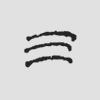三
